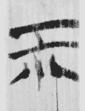{示工}
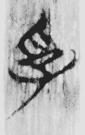孚
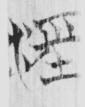涇
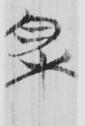{肉木}
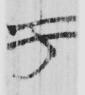于
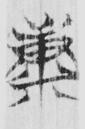庚
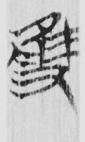雘
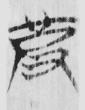皮
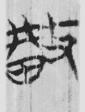{井田攴}
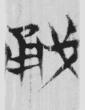{甬戈}
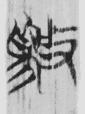{爲攴}
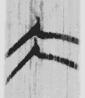大
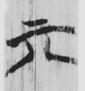亓
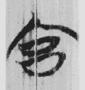宮
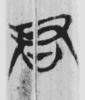君
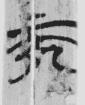而
